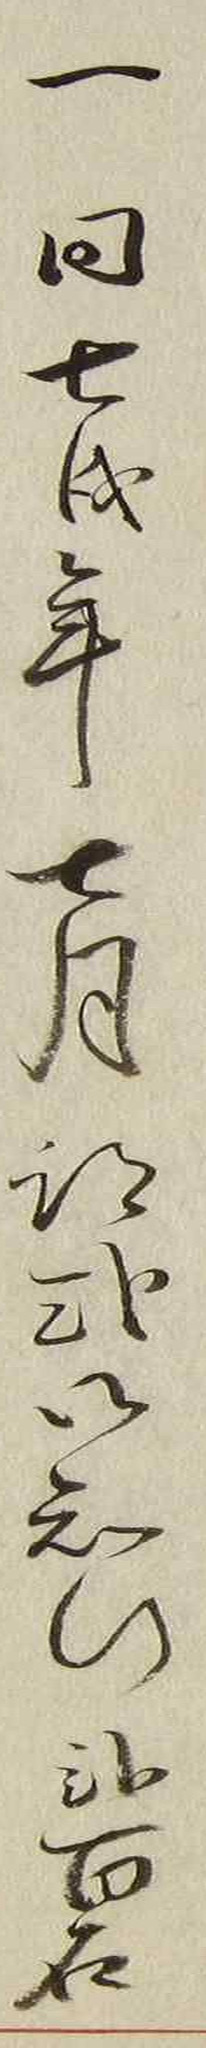一同七戌年七月跡式御知行弐百石

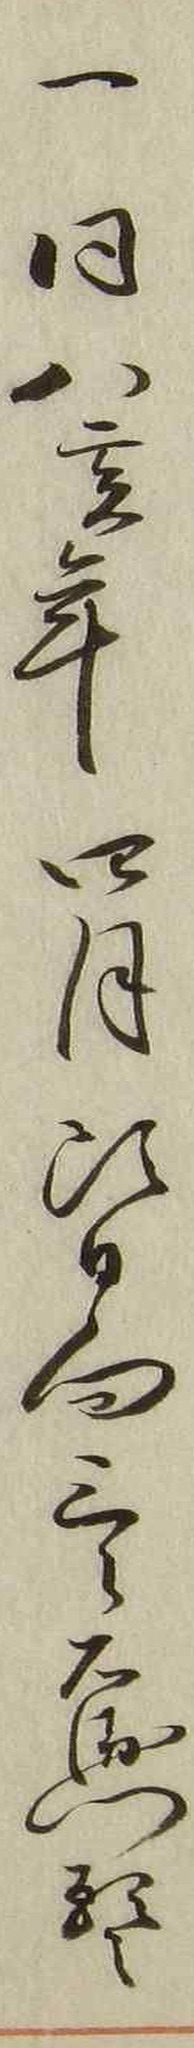一同八亥四月頭日向三郎右衛門願い之
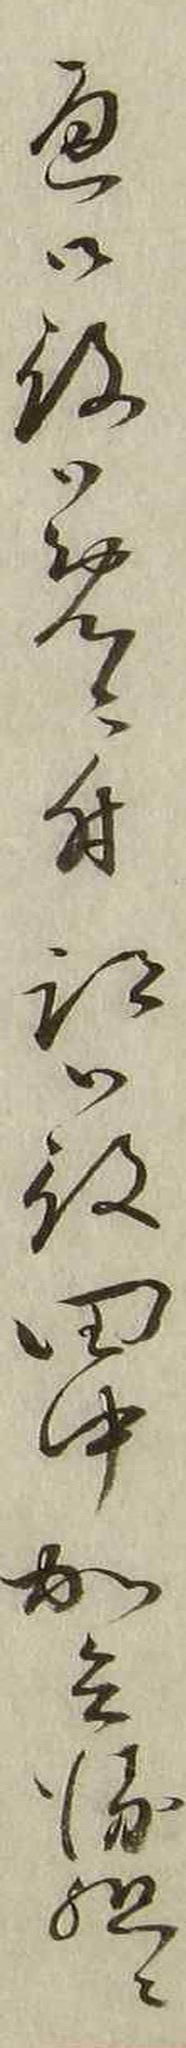通り御役御免ニ付き跡御役田中加兵衛組ニ
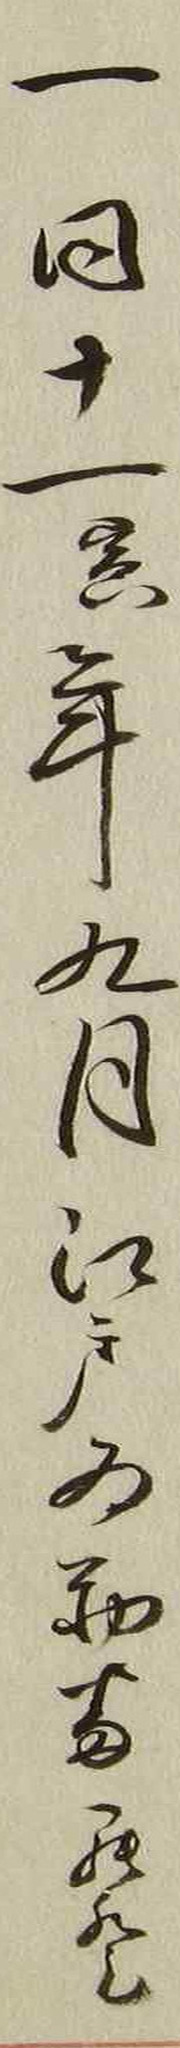一同十一寅年九月江戸勤番之為罷り登り
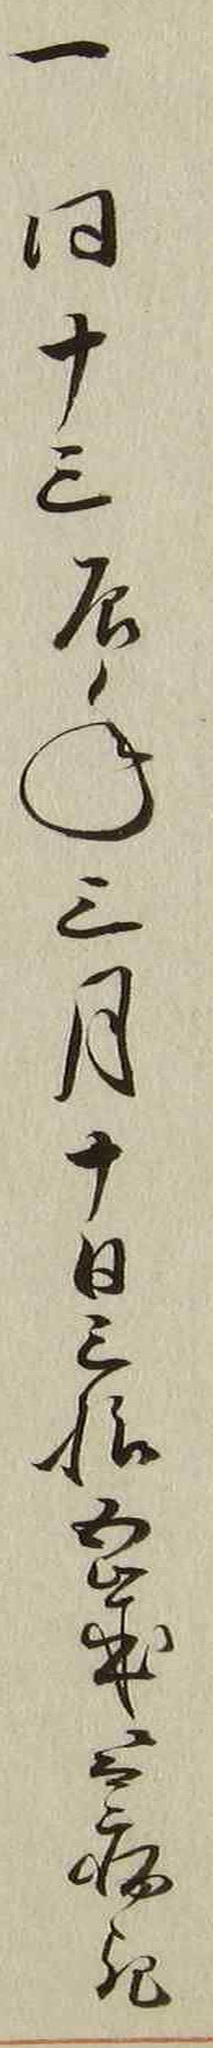一同十三辰年三月十日三拾五歳ニて病死
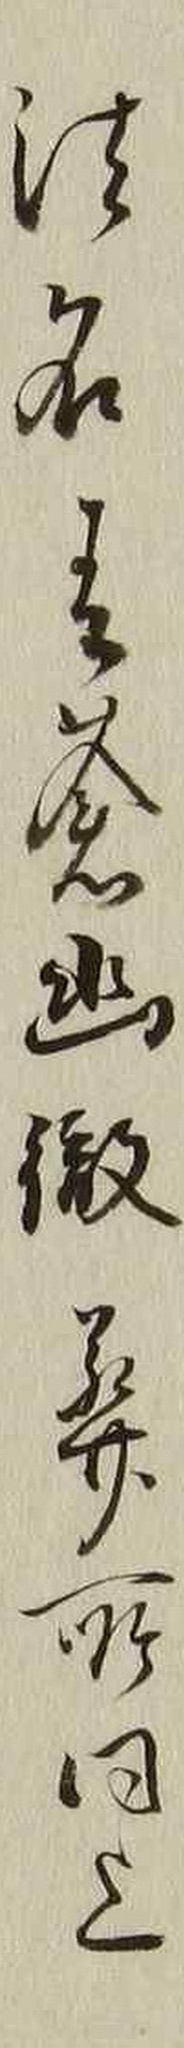法名春蒼幽徹葬所同上
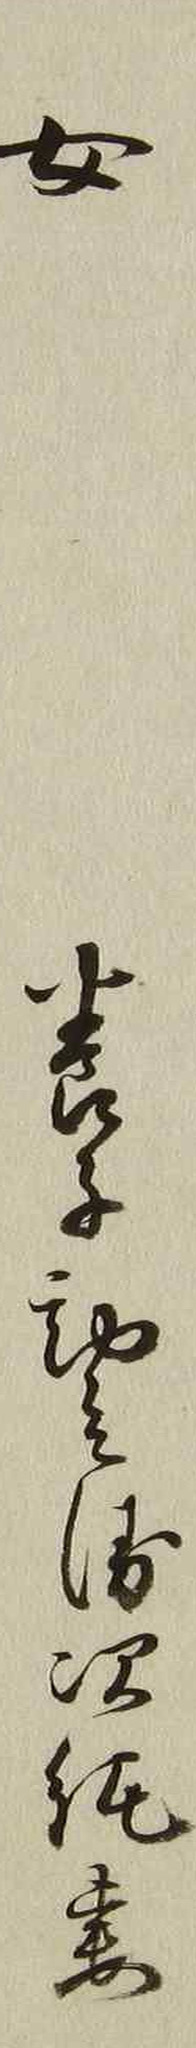女養子勘定兵衛次純妻
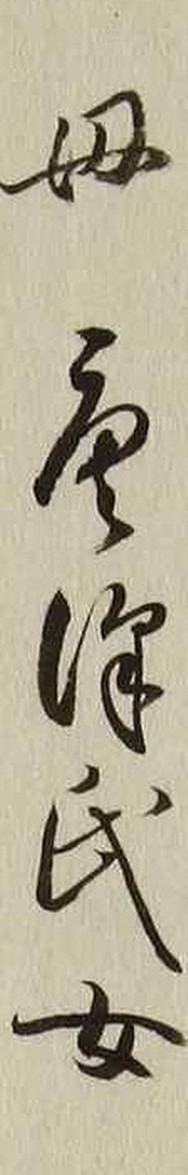母唐沢氏女
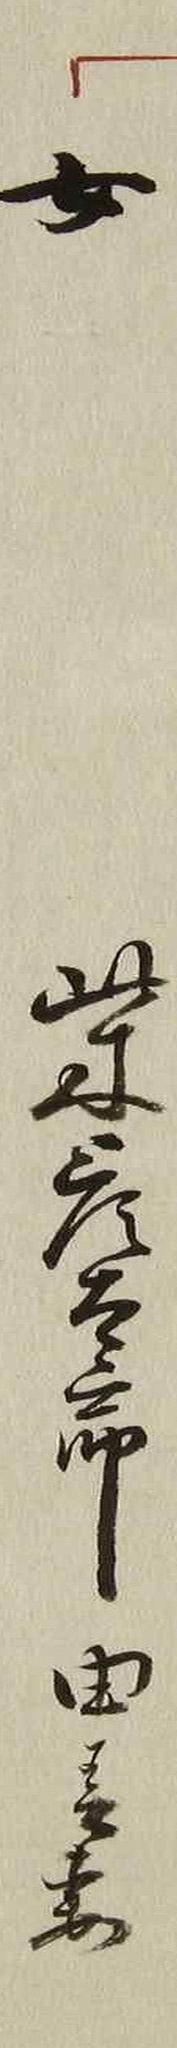女柴彦太郎由春妻
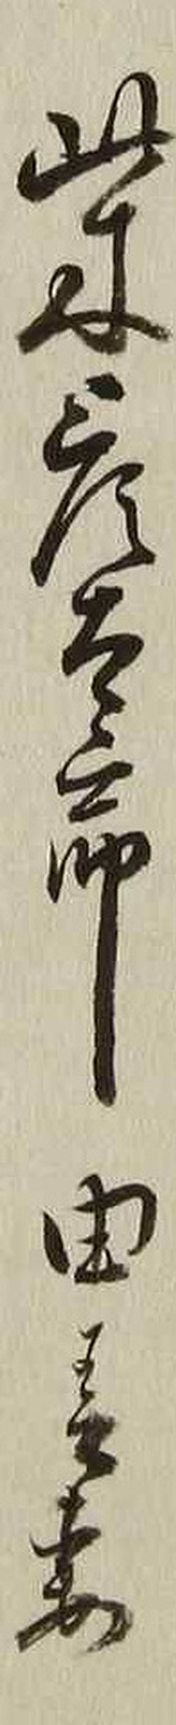女柴彦太郎由春妻
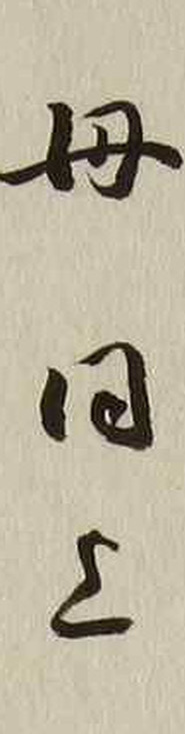母同上
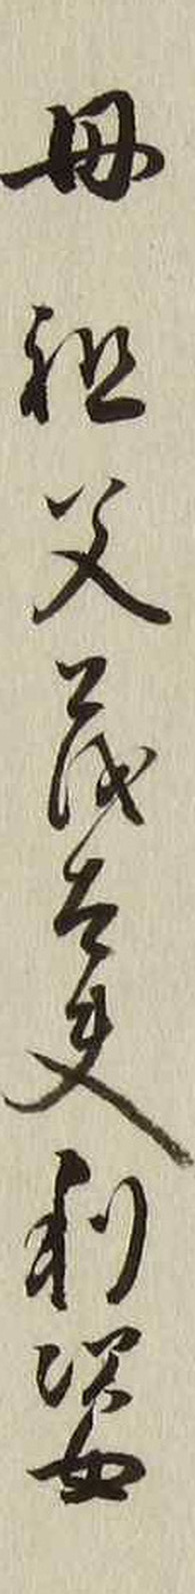母祖父茂大夫利次女
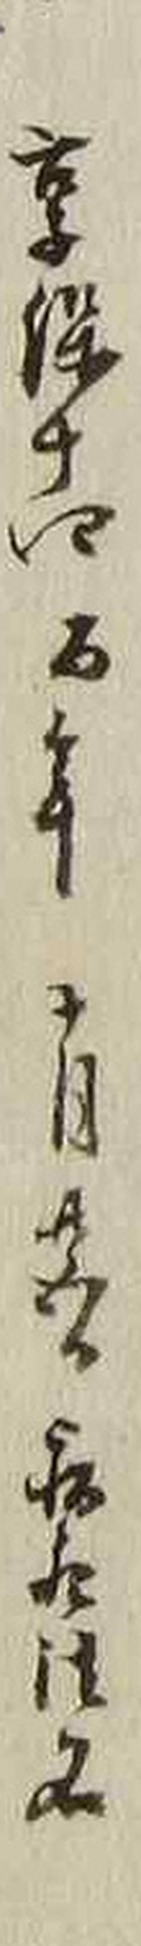享保十四酉年十月廿五日病死法名
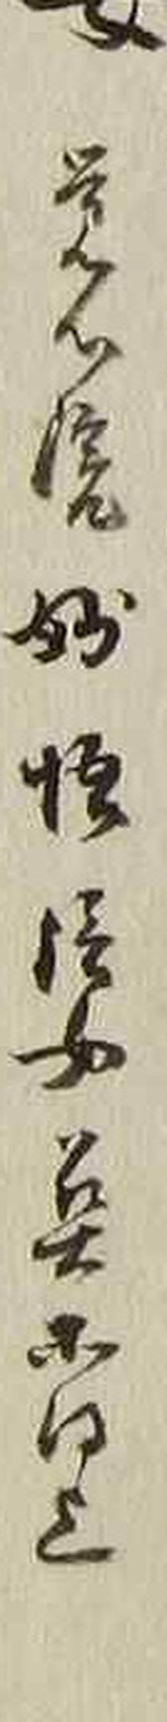覚心院妙軽信女葬所同上
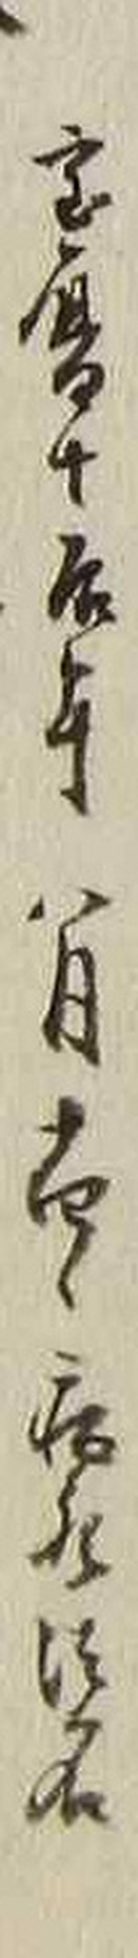宝暦十辰年八月十四日病死法名
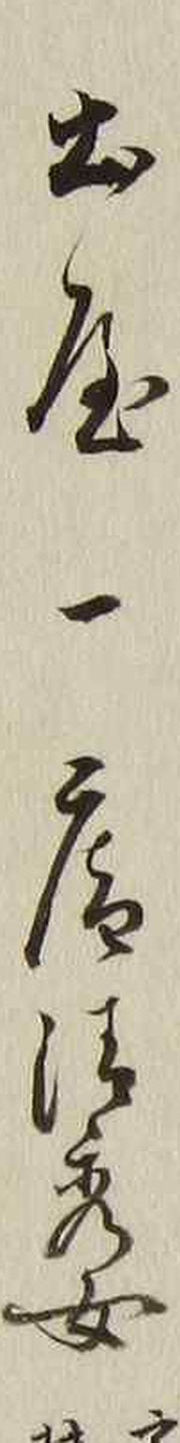土屋一庵清秀女
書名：諸士系譜　巻之20　い之部20
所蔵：会津若松市立会津図書館
